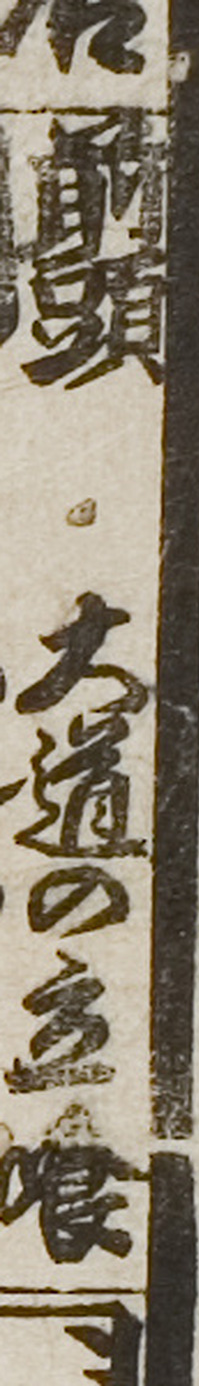前頭大道の立喰
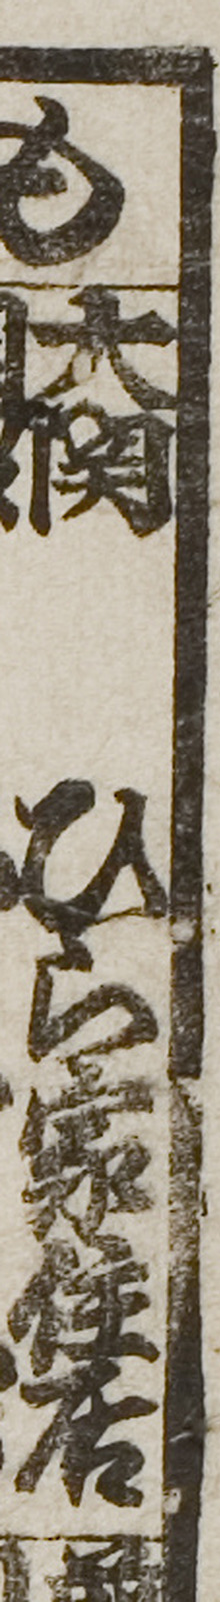大関ひら家住居
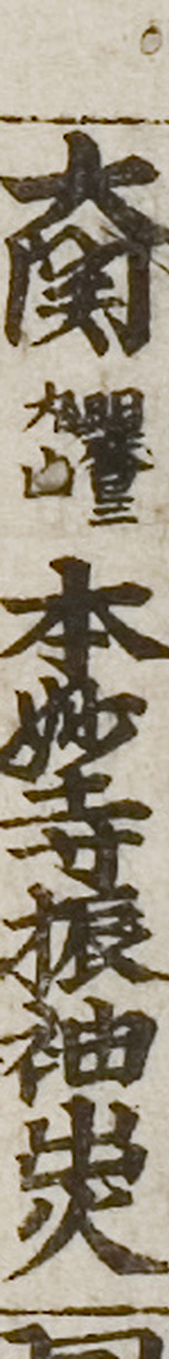大関明暦三丸山本妙寺振袖出火
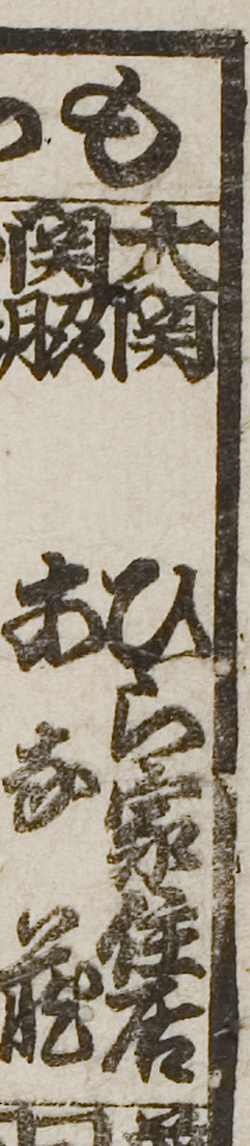大関ひら家住居
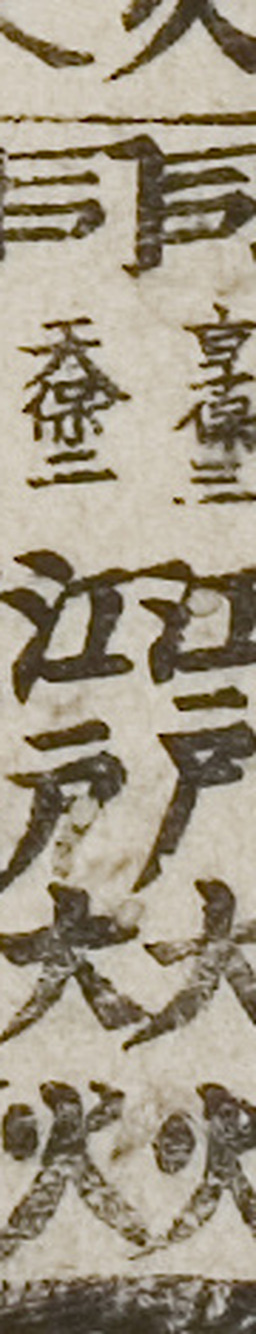同天保二江戸大火
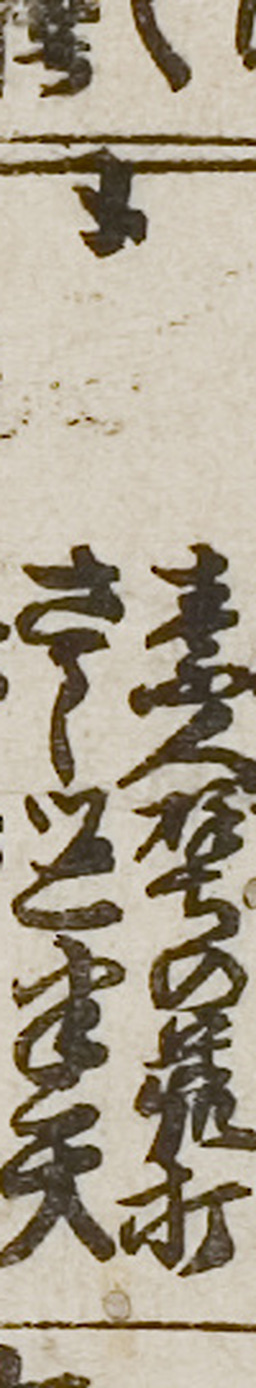同さしツこ半天
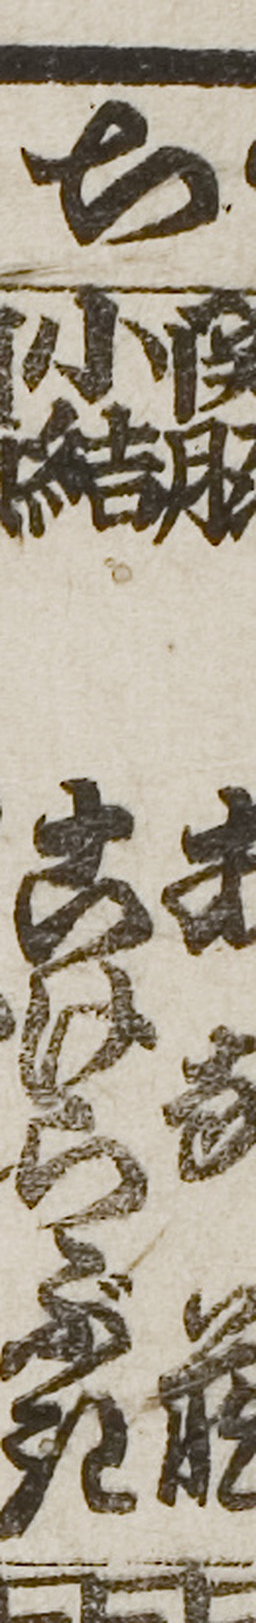小結こけらぶき
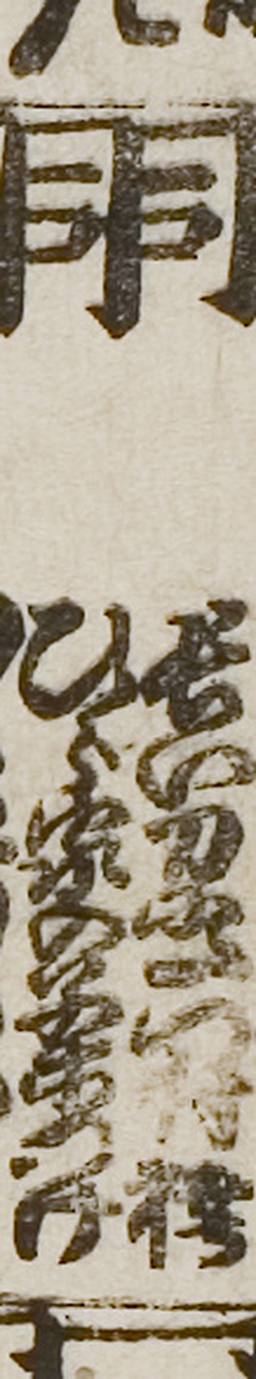同ひら家の茶つけ
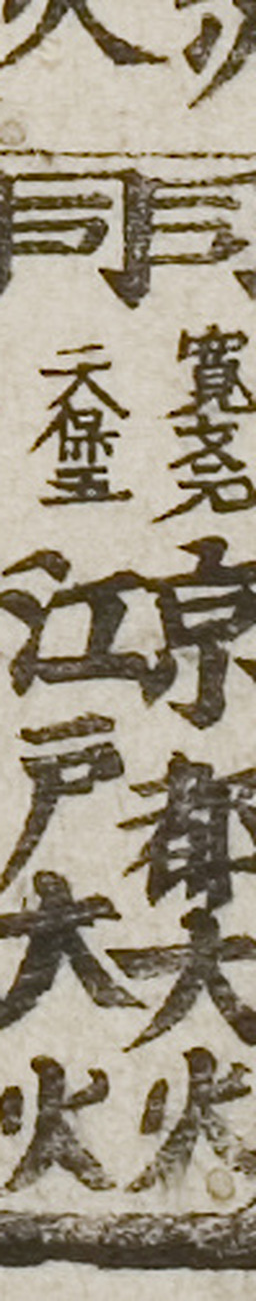同享保三江戸大火
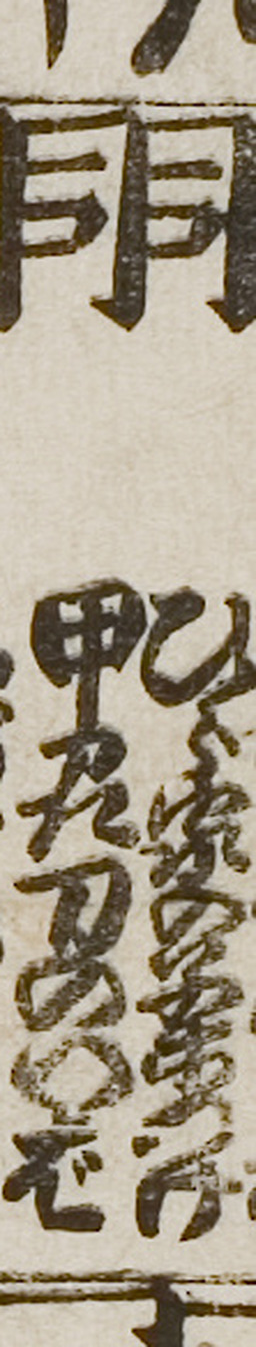同甲州刀のつば
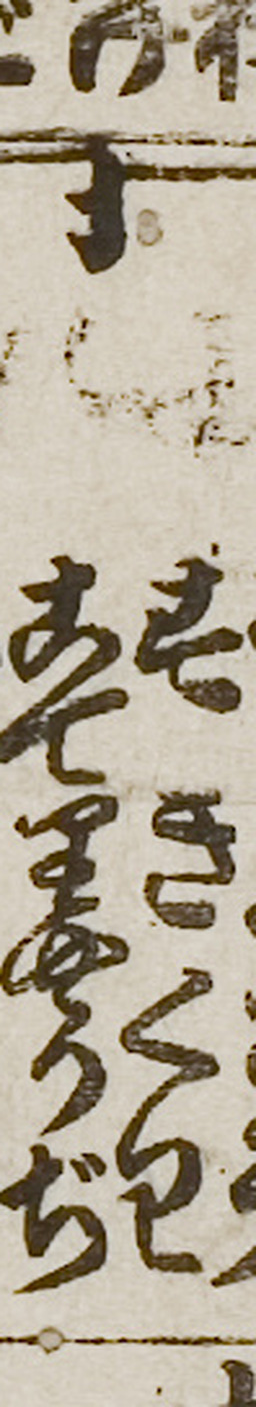同こてりやうぢ
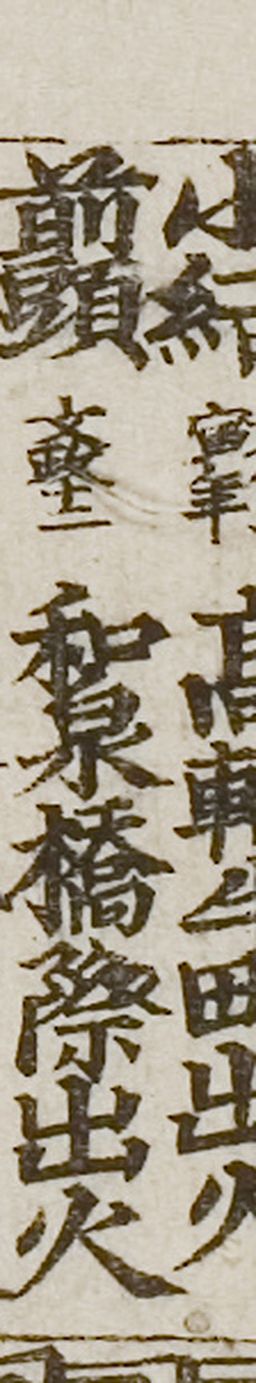前頭文政十二和泉橋際出火
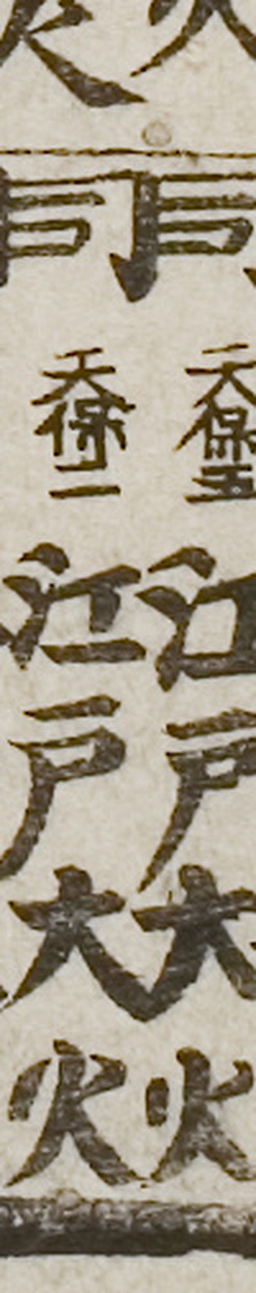同天保二江戸大火
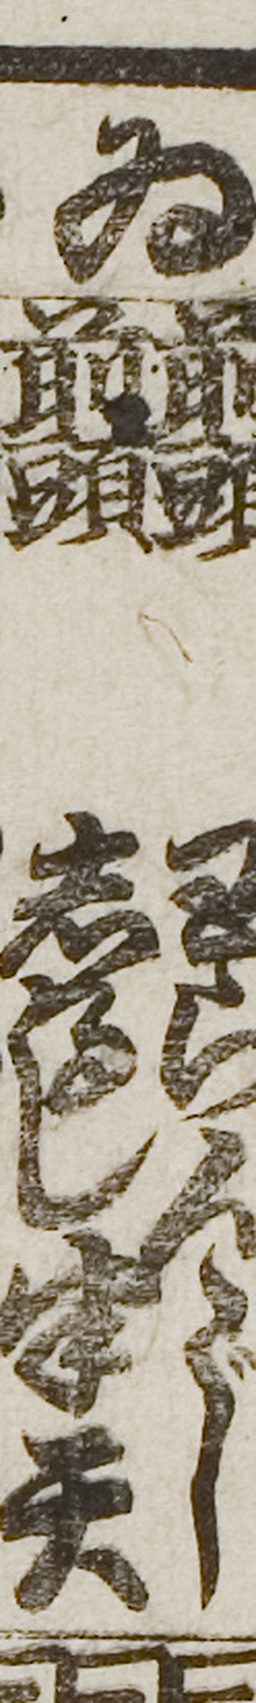前頭しるし半天
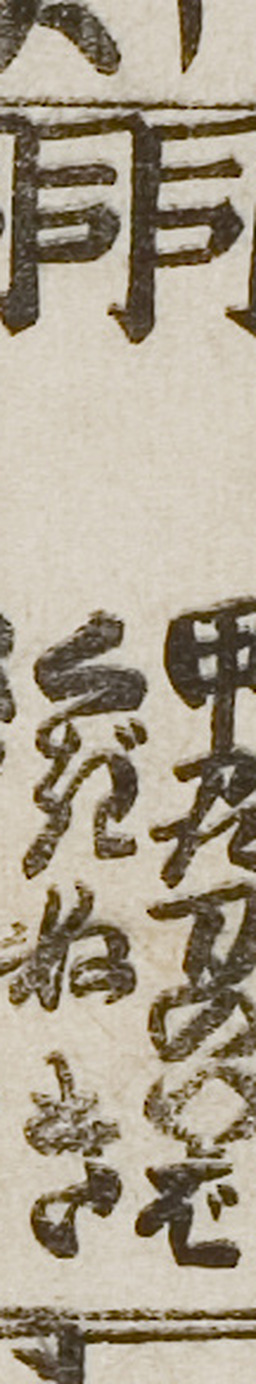同くぎぬき
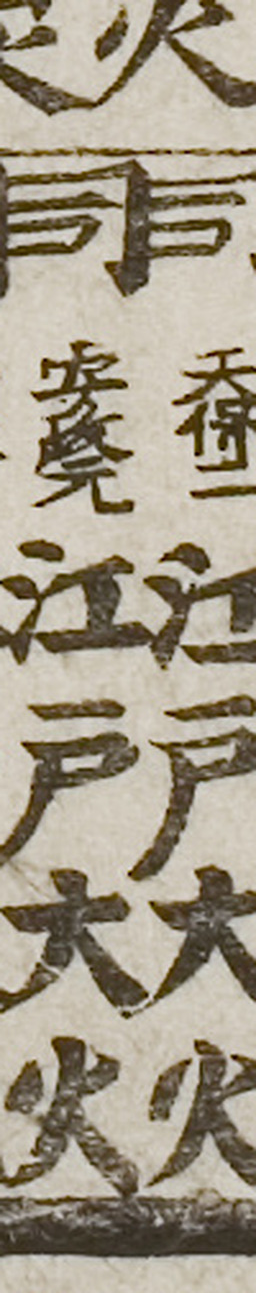同安政元江戸大火
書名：世中当座帳
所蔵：東京大学総合図書館 General Library in the University of Tokyo, JAPAN
